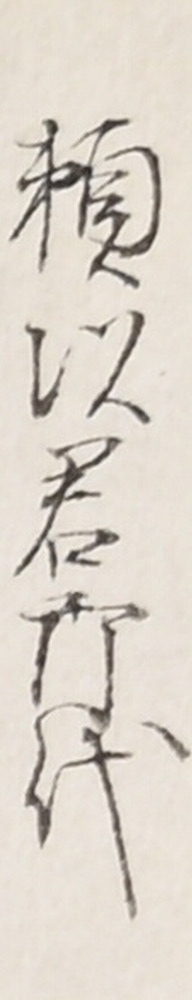頼以君御代
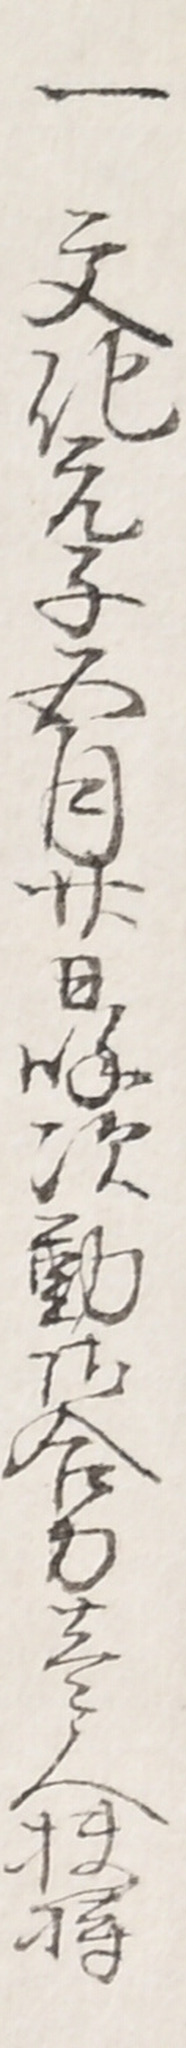一文化元子五月廿日呼次勤御合力壱人扶持
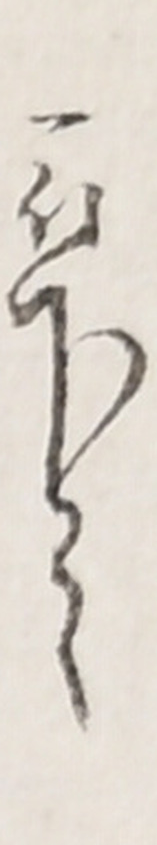被下之
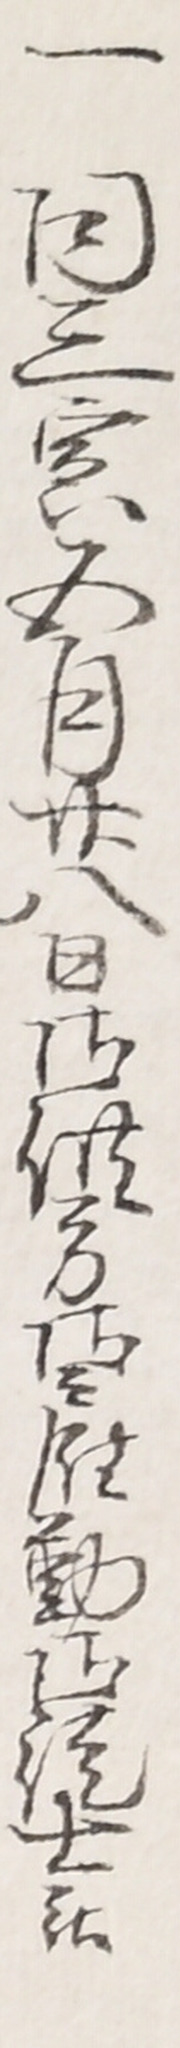一同三寅五月廿八日御供方御雇勤御徒士被
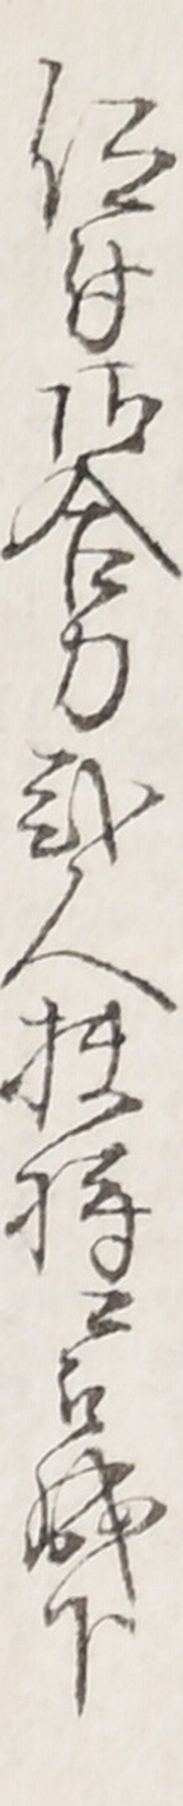仰付御合力弐人扶持ニ被成下
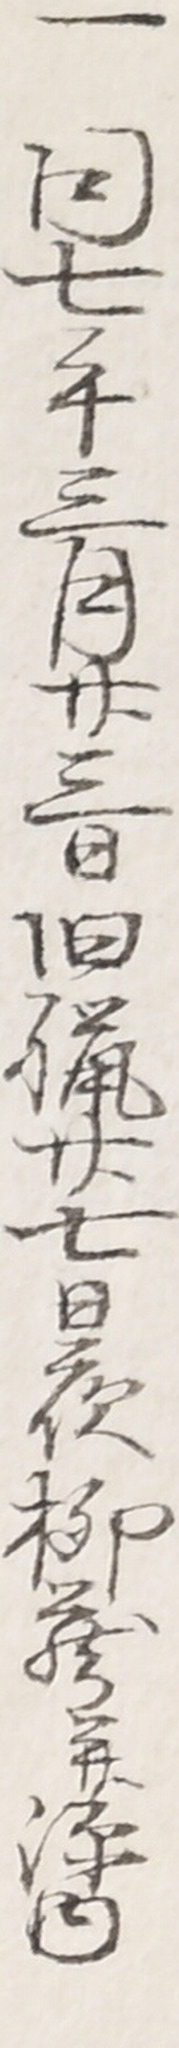一同七午三月廿三日旧臘廿七日夜柳蔵并源内
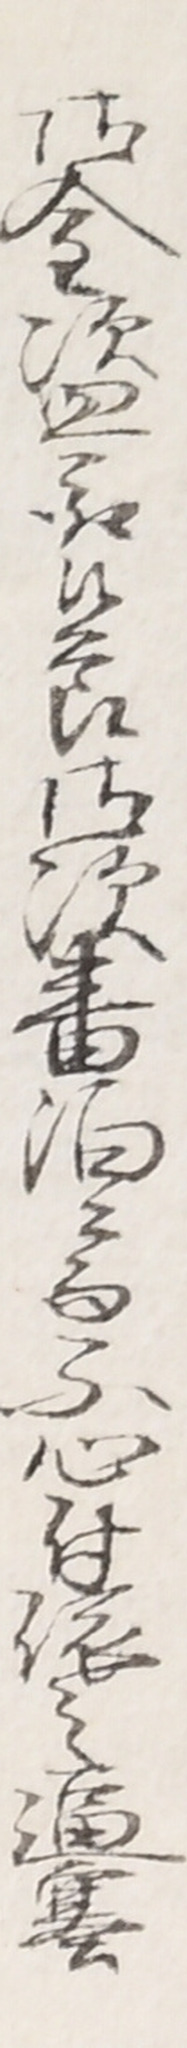御金盗取候節御次番泊ニ而不心付依之逼塞
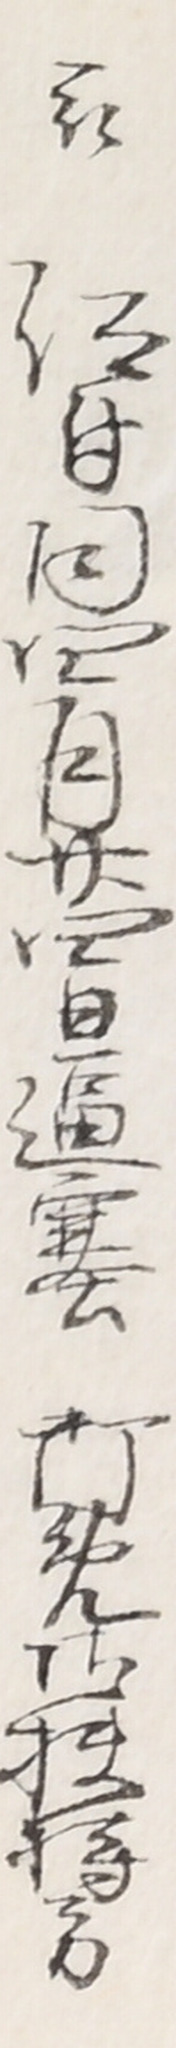被仰付同四月廿四日逼塞御免御扶持方
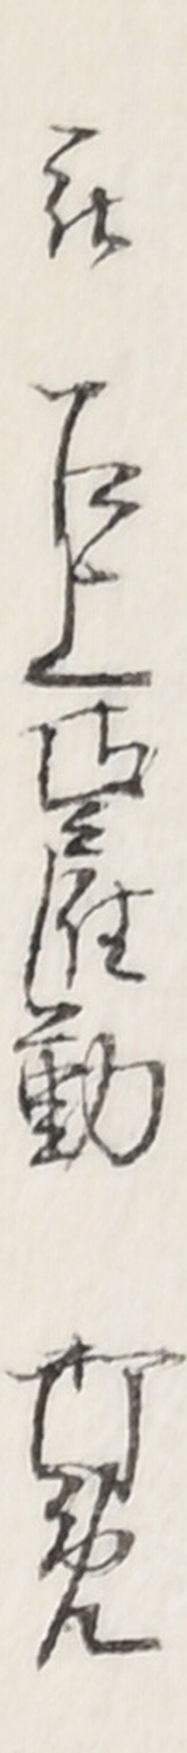被召上御雇勤御免
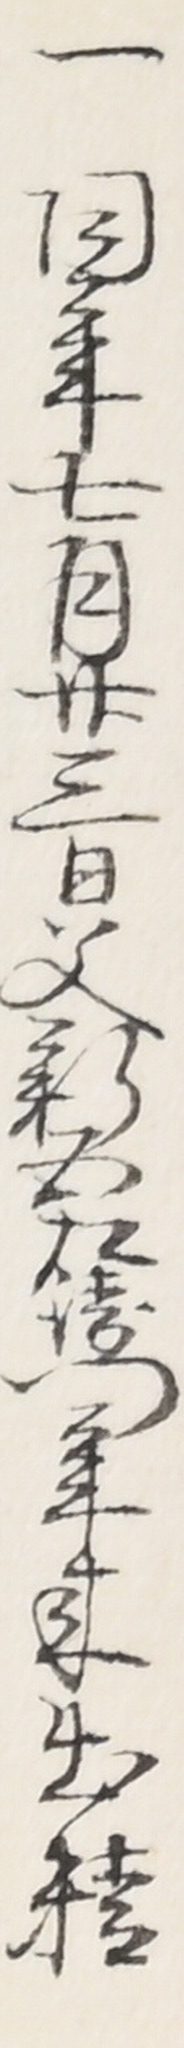一同年七月廿三日父新五左衛門年来出精
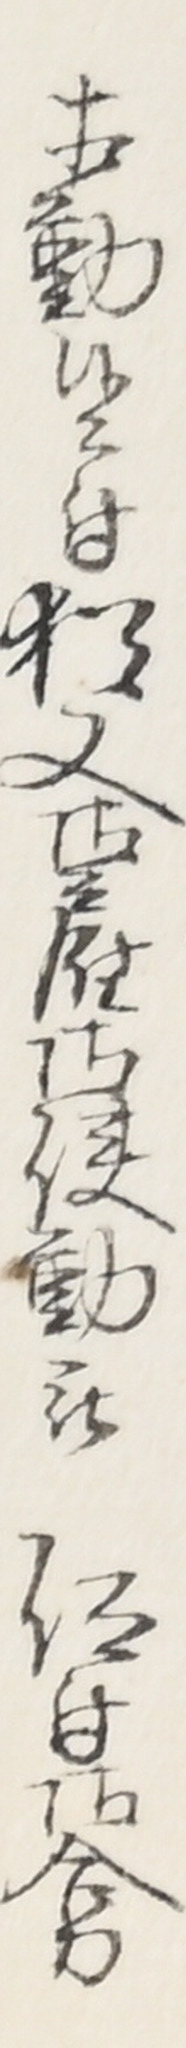相勤候二付猶又御雇御使勤被仰付御合力
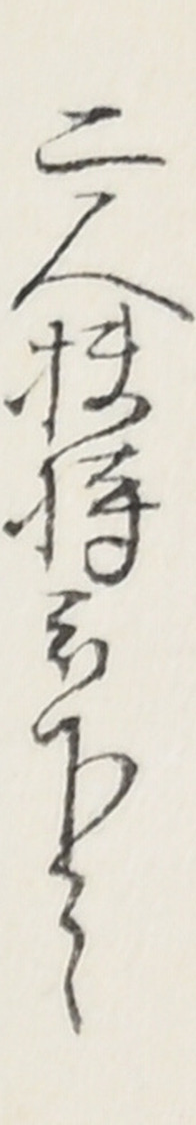二人扶持被下之
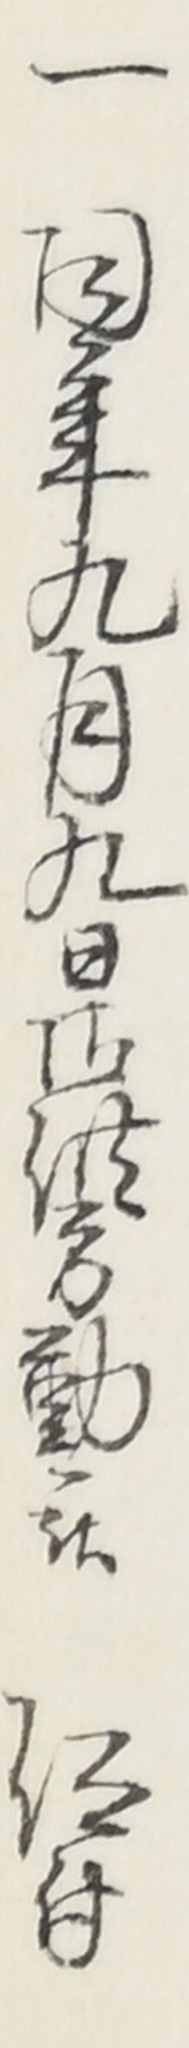一同年九月九日御供方勤被仰付
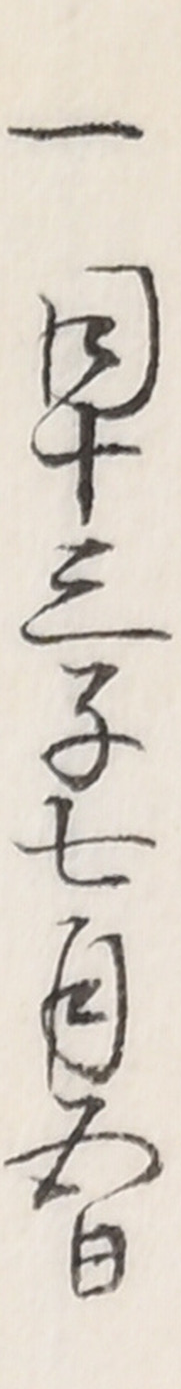一同十三子七月五日
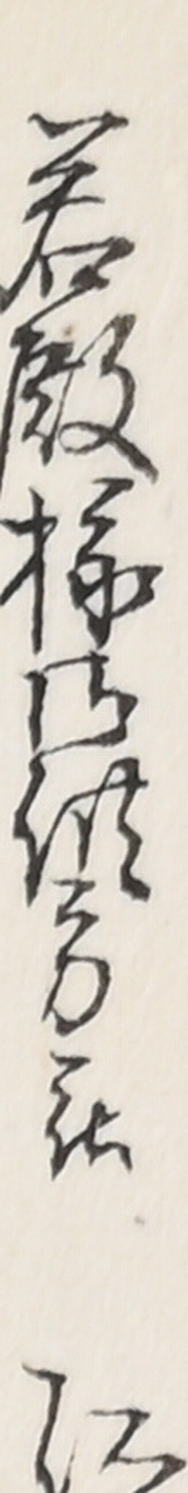若殿様御供方被仰付
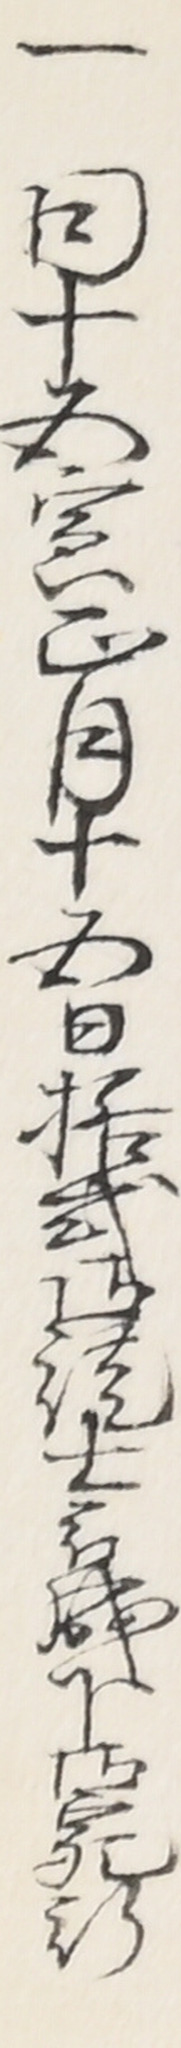一同十五寅正月十五日格式御徒士被成下御宛行
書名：無足諸士勤仕録（四）
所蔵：伊那市立高遠町図書館・合同会社AMANE
